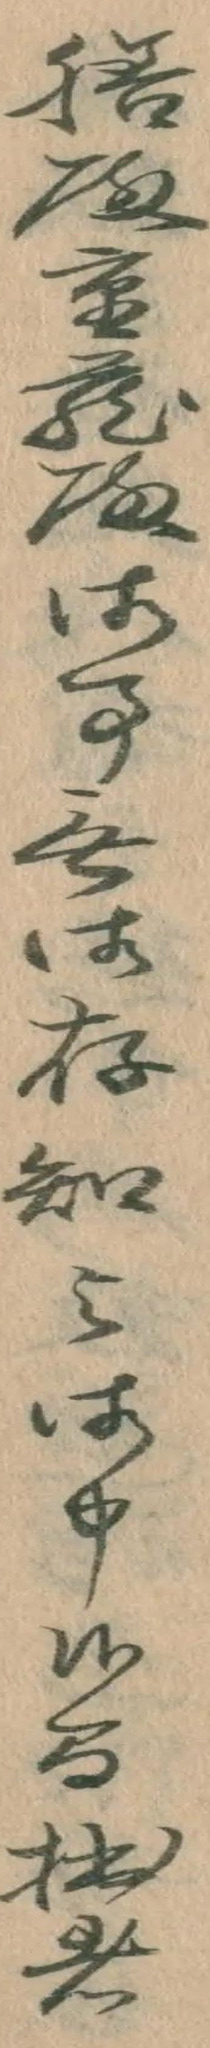膳殿重蔵殿御事無御存知与御申候間拙者
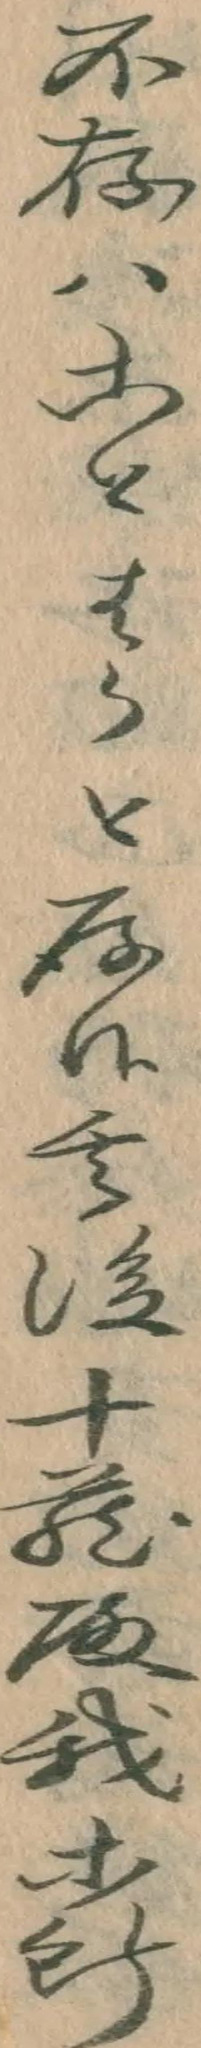不存は古と者らと存候其後十蔵殿我等所
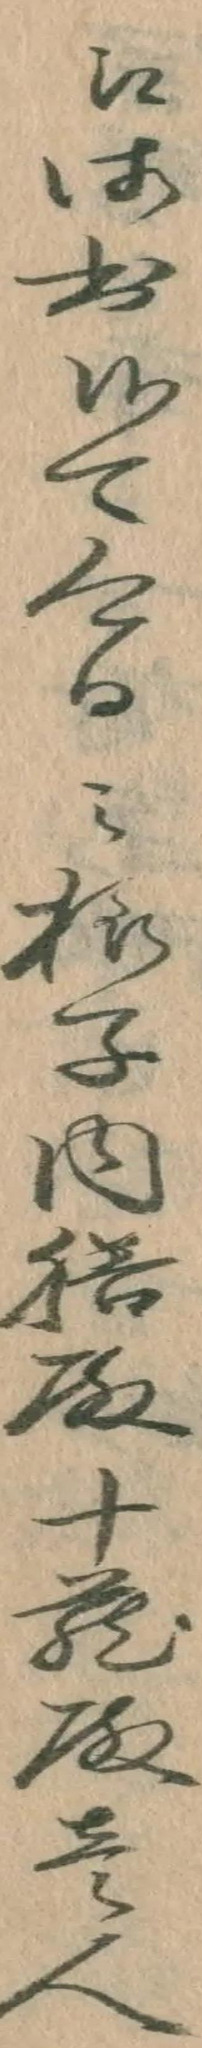江御出候て今日之様子内膳殿十蔵殿壱人
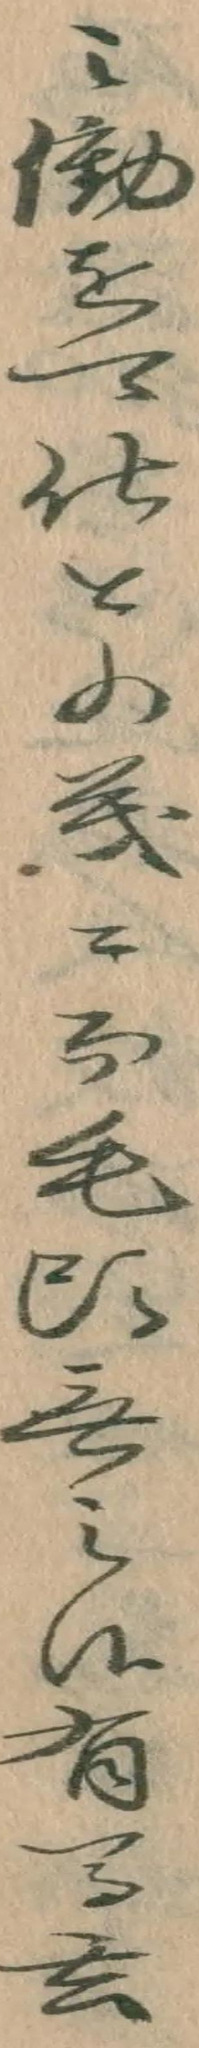に働を可仕との義に而毛頭無之候有馬玄
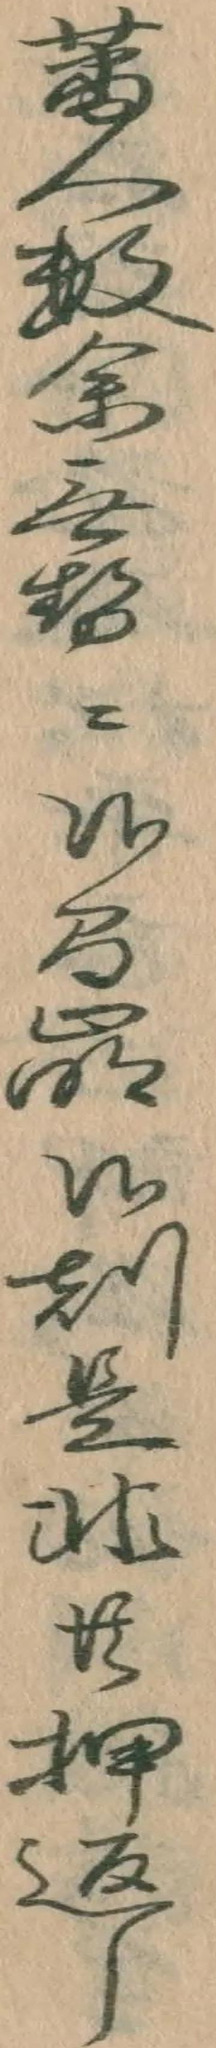蕃人数余無勢に候間崩候刻是非共押返し
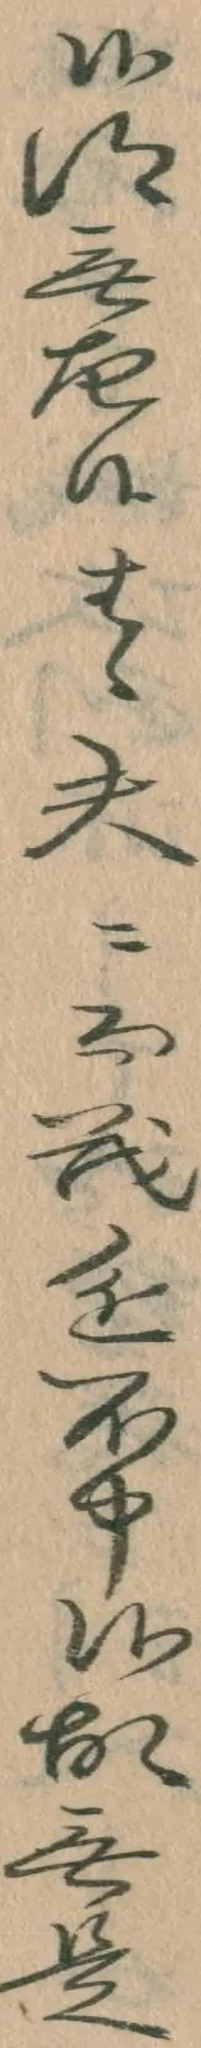候得無左候者々夫に而茂進不申候故無是
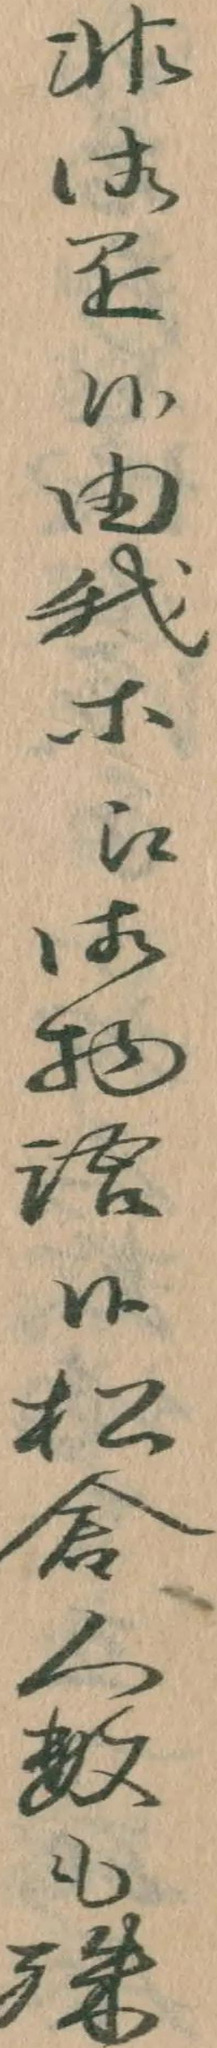非御懸候由我等江御物語候松倉人数も殊
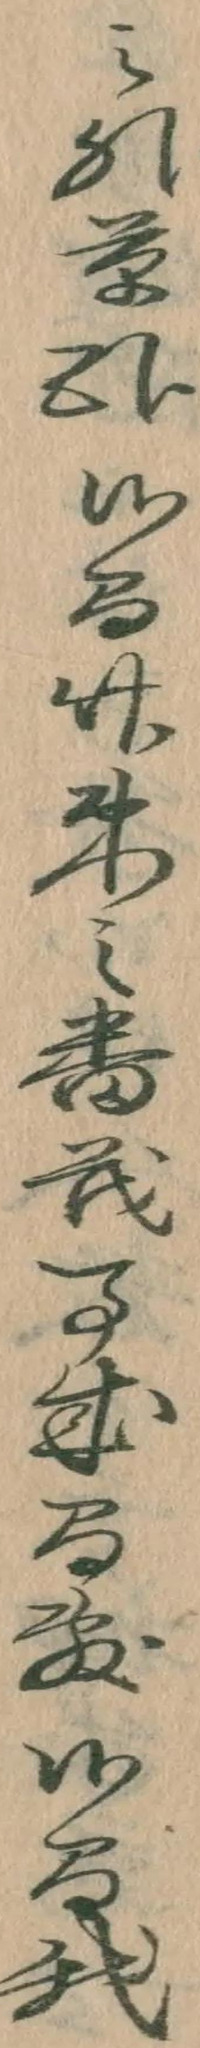之外草臥候間竹束之番茂事成間敷候間我
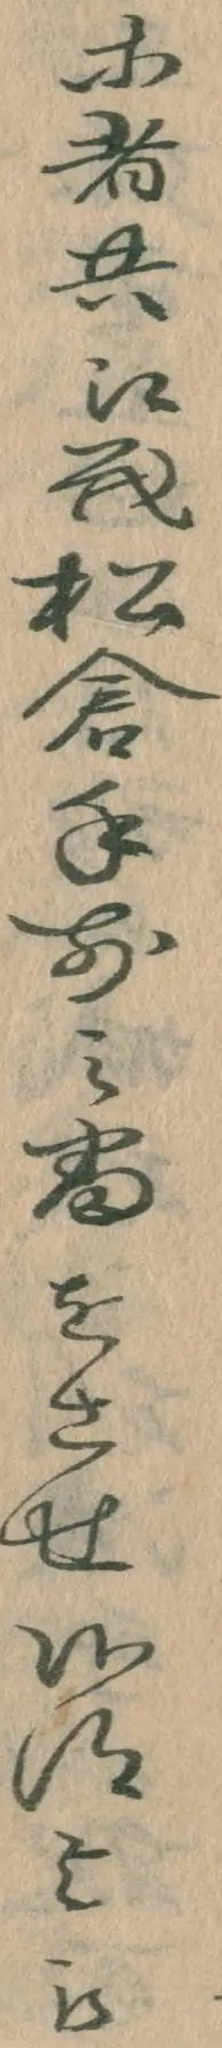等者共江茂松倉手前之番をさせ候得与被
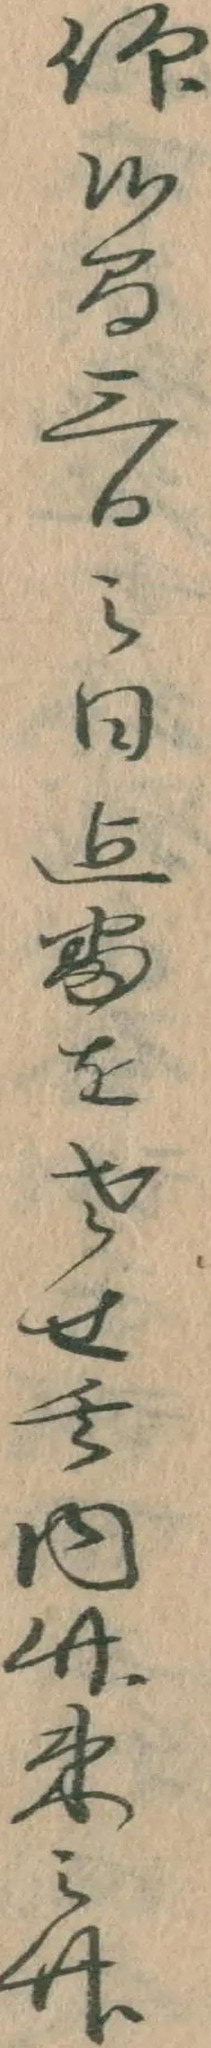仰候間三日之日迄番をさせ其内竹束之竹
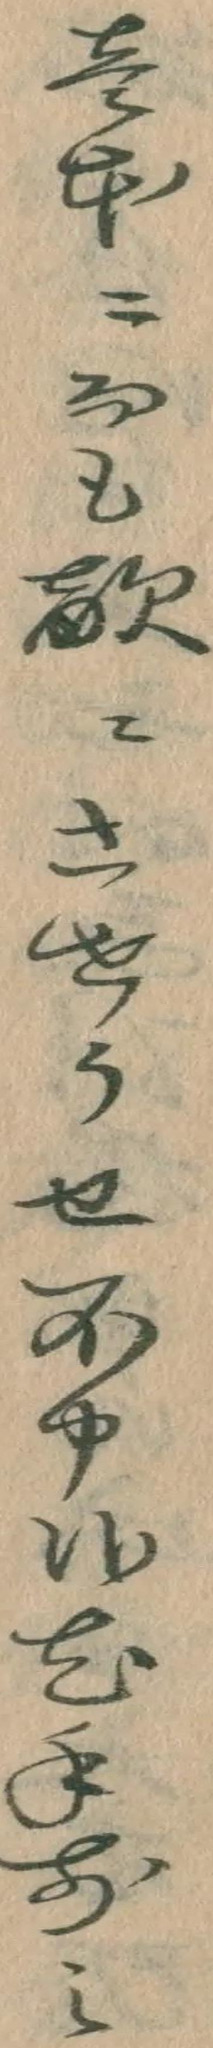壱本に而も敵にさせらせ不申候尤手前之
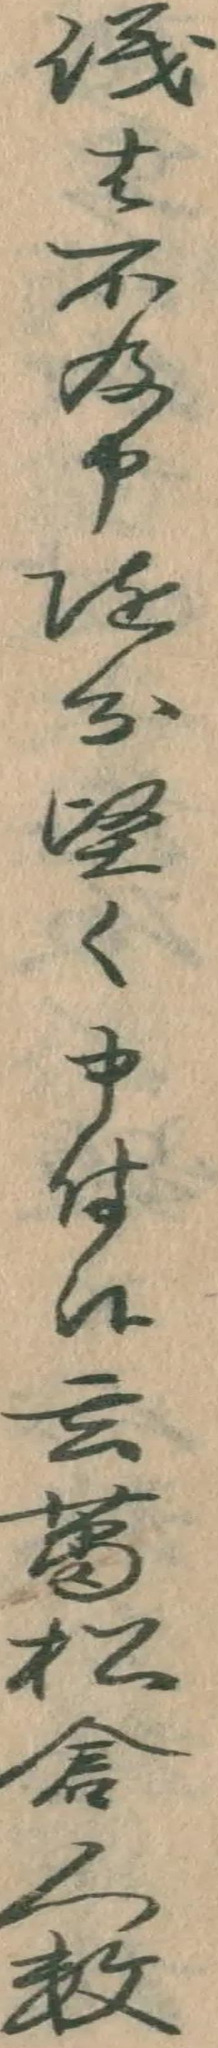儀者不及申随分堅く申付候玄蕃松倉人数
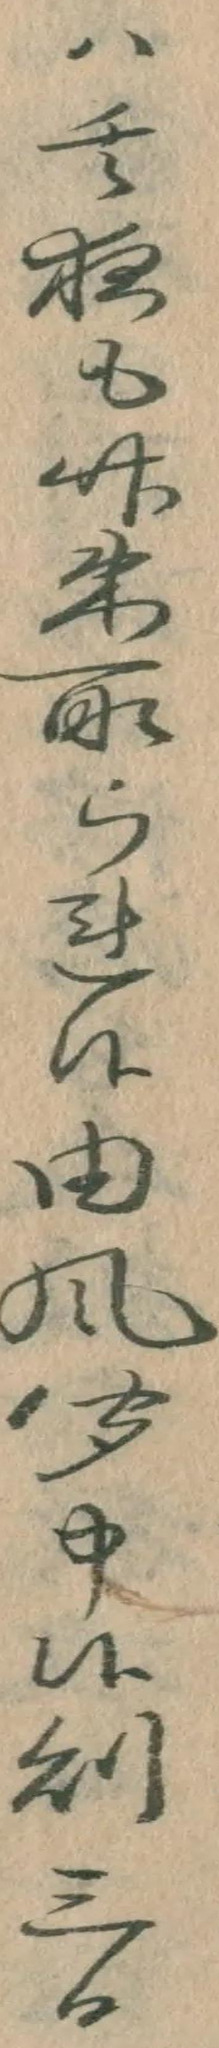は其夜も竹束取ら連候由風聞申候刻三日
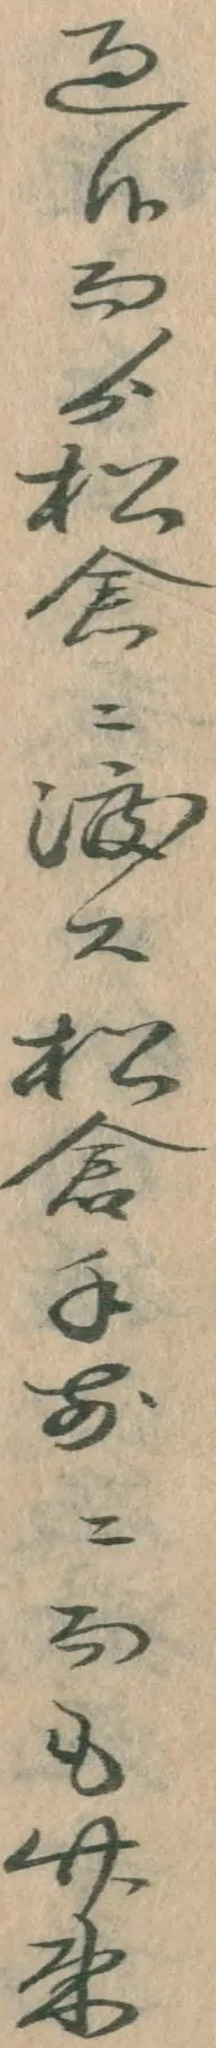過候而ゟ松倉に渡す松倉手前に而も竹束
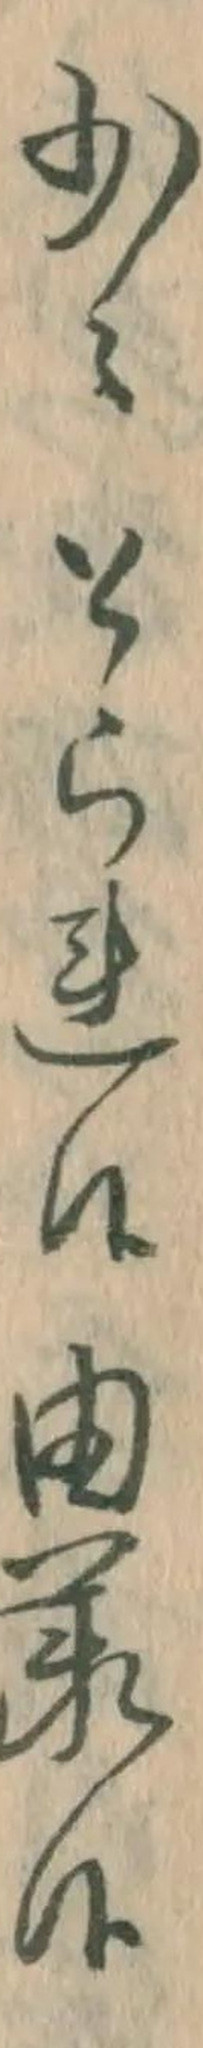少々とら連候承候
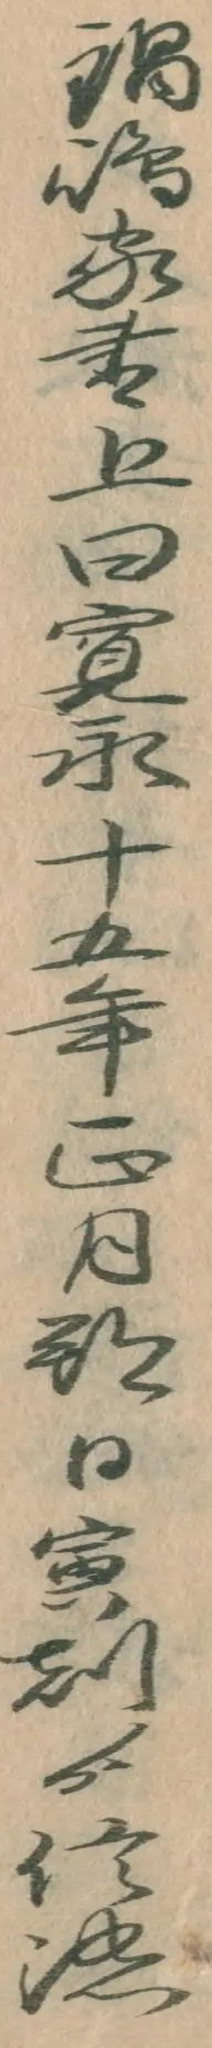鍋島家書上曰寛永十五年正月朔日寅刻ゟ信濃
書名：切支丹御退治記 49巻. [5]
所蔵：国立国会図書館 National Diet Library, JAPAN
